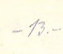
-13.-
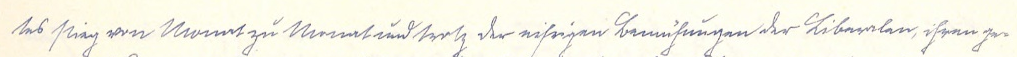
tes stieg von Monat zu Monat und trotz der eifrigen Bemühungen der Liberalen, ihren ge-
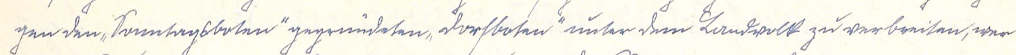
gen den "Sonntagsboten" gegründeten "Dorfboten" unter dem Landvolk zu verbreiten, war
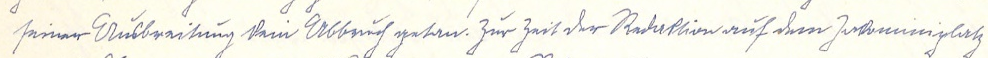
seiner Ausbreitung kein Abbruch getan. Zur Zeit der Redaktion auf dem Jakominiplatz
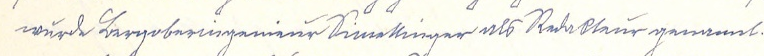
wurde Bergoberingenieur Simettinger als Redakteur genannt.
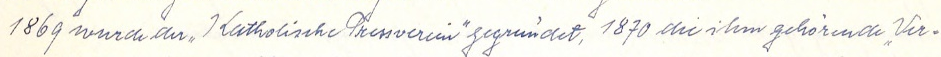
1869 wurde der "Katholische Presseverein" gegründet, 1870 die ihm gehörende "Ver-
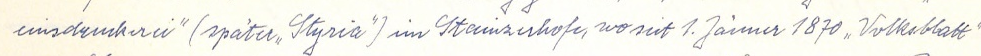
einsdruckerei" (später "Styria") im Stainzerhofe, wo seit 1. Jänner 1870 "Volksblatt"
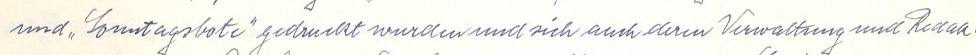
und "Sonntagsbote" gedruckt wurden und sich auch deren Verwaltung und Redak-
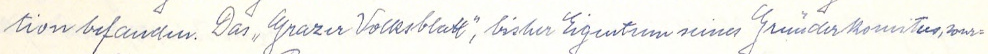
tion befanden. Das "Grazer Volksblatt", bisher Eigentum seines Gründerkomites, wur-
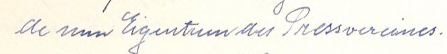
de nun Eigentum des Pressevereines. -
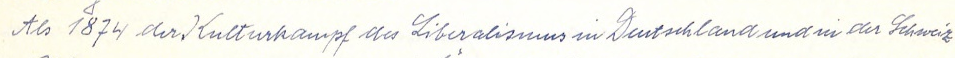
Als 1874 der Kulturkampf des Liberalismus in Deutschland un in der Schweiz
